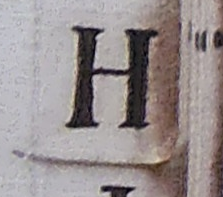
H
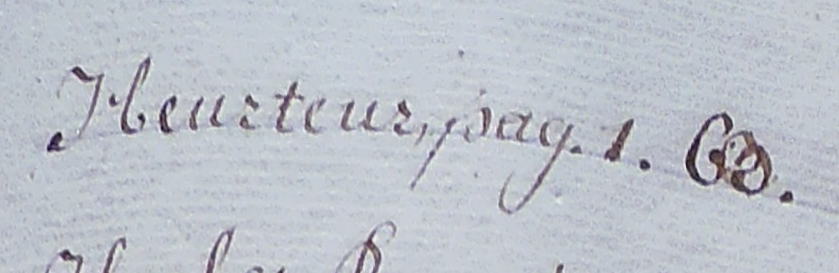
Heurteur, pag. 1. 63.
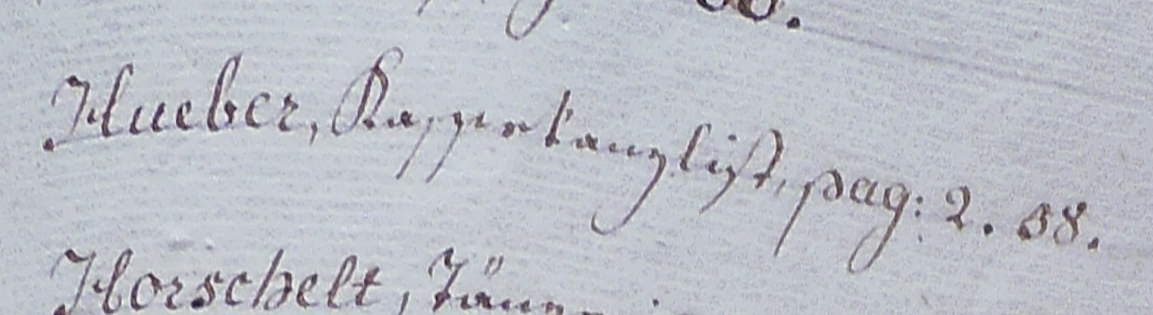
Hueber, Kassekanzlist, pag: 2. 58.
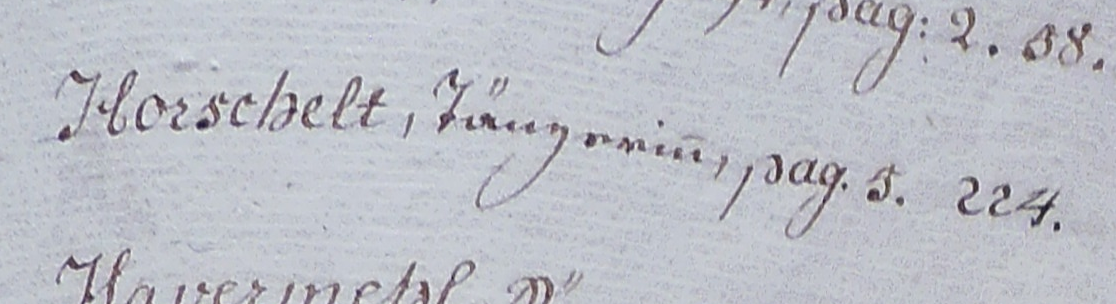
Horschelt, Tänzerin̅, pag. 5. 224.
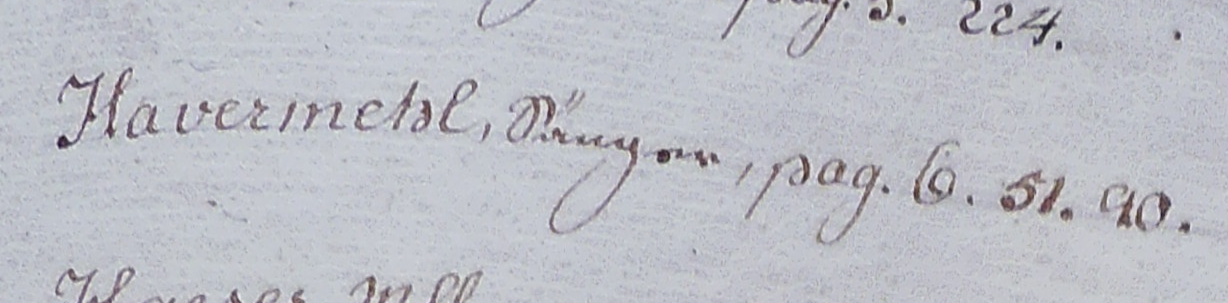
Havermehl, Sänger, pag. 6. 51. 90.
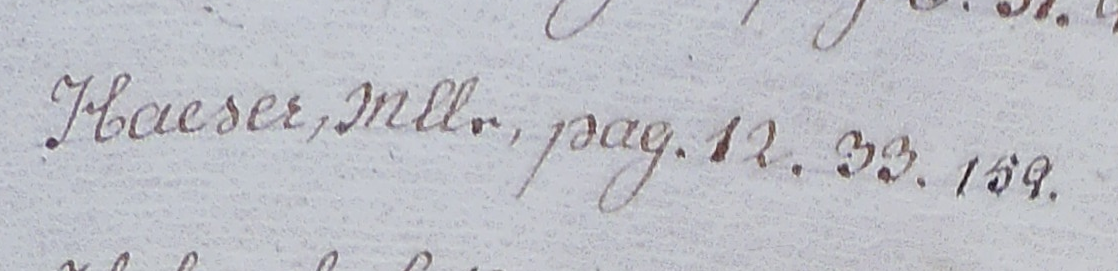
Haeser, Mlle, pag. 12. 33. 159.
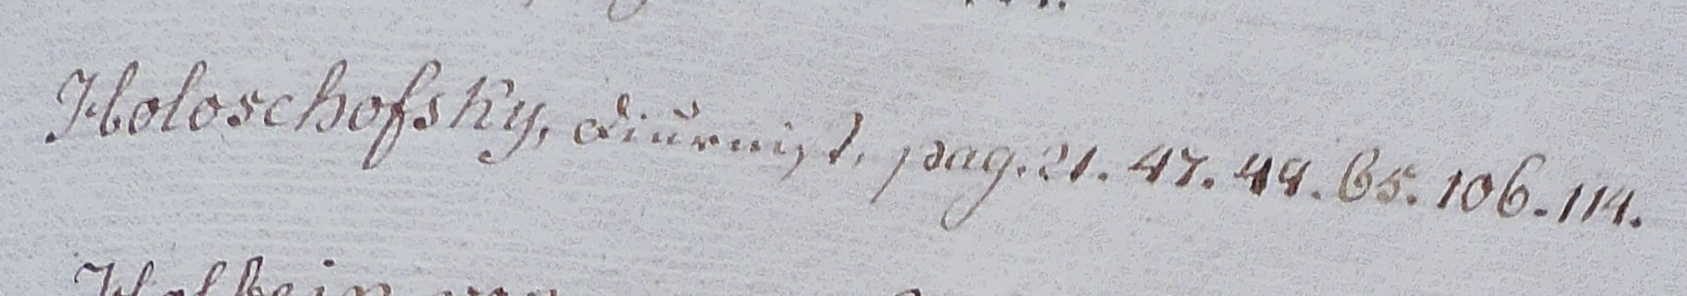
Holoschofsky, Diurnist, pag. 21. 47. 49. 65. 106. 114.
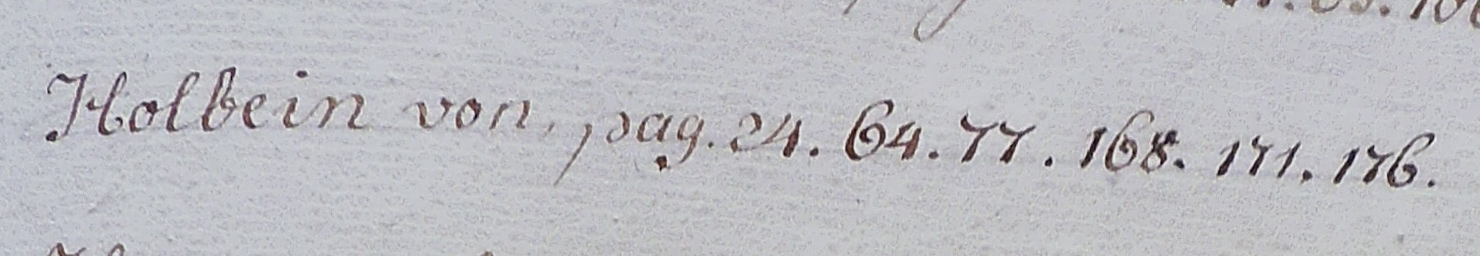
Holbein von, pag. 24. 64. 77. 168. 171. 176.
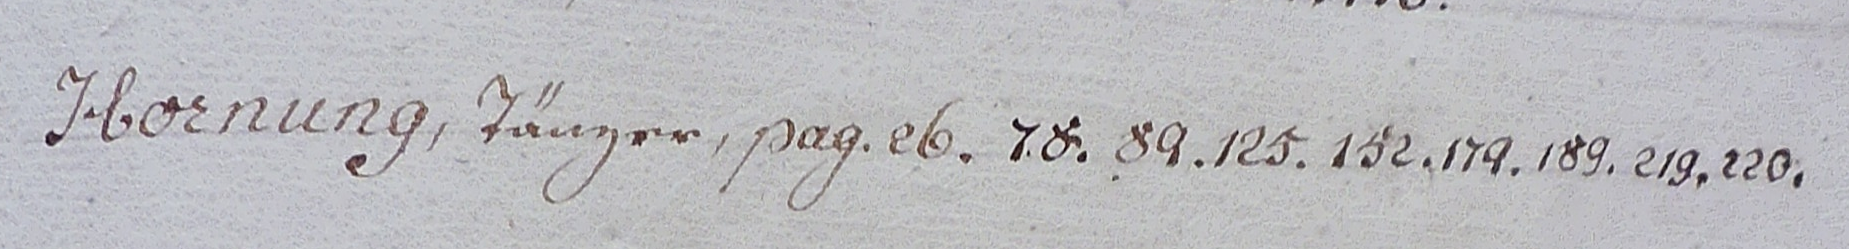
Hornung, Tänzer, pag. 26. 78. 89. 125. 152. 179. 189. 219. 220.
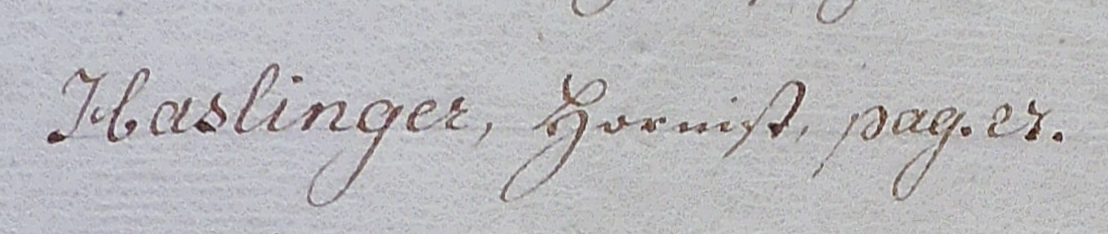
Haslinger, Hornist, pag. 27.
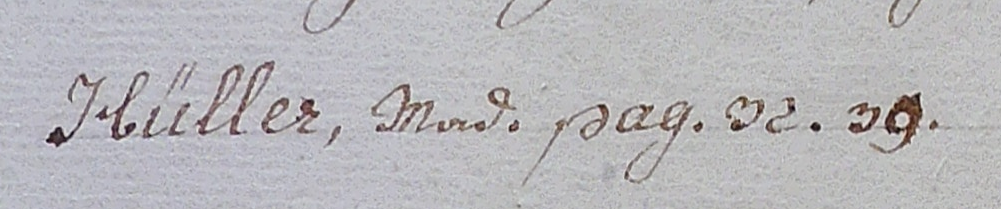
Hüller, Mad. pag. 32. 39.
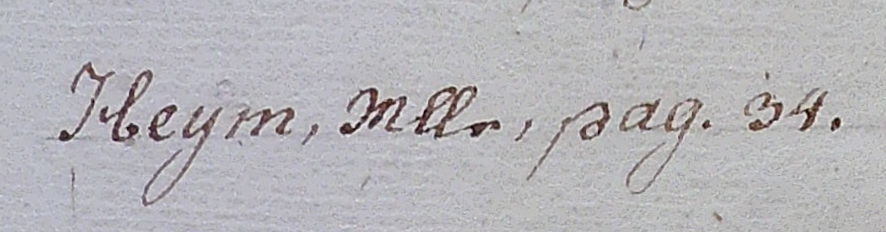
Heym, Mlle, pag. 34.
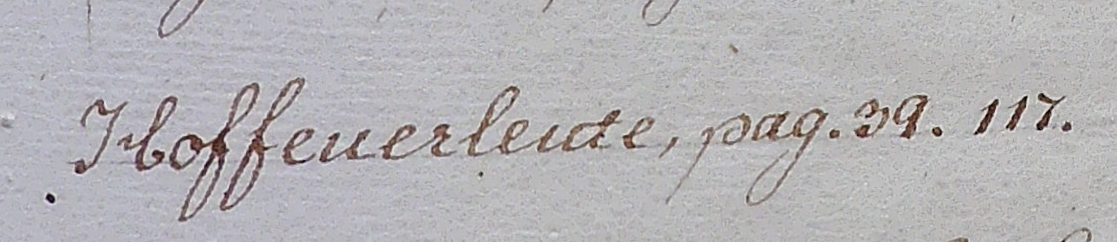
Hoffeuerleute, pag. 39. 117.
